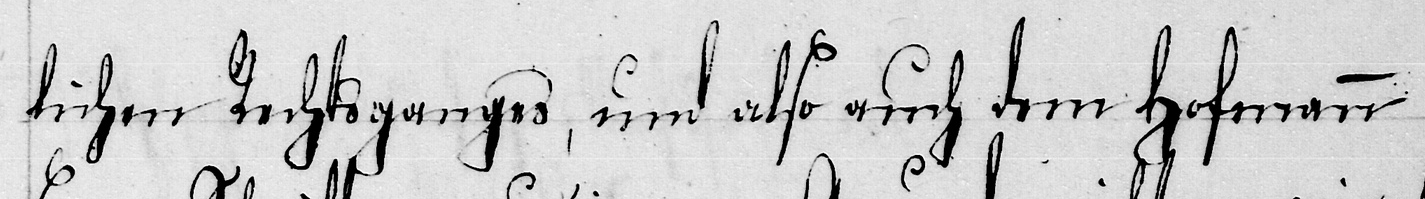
lichen Rechtsganges, und also auch dem Hofmann
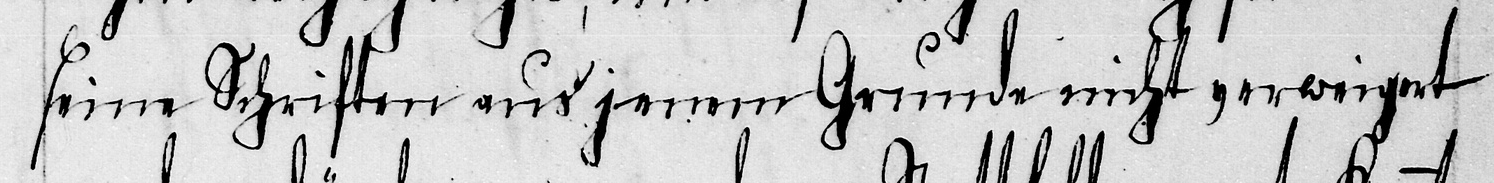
seine Schriften aus jenem Grunde nicht verweigert
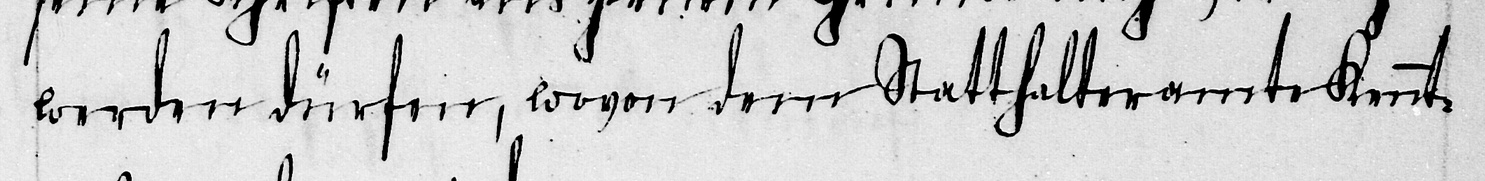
werden dürfen, wovon dem Statthalteramte Kennt¬
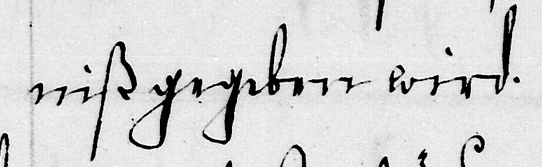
niß gegeben wird.
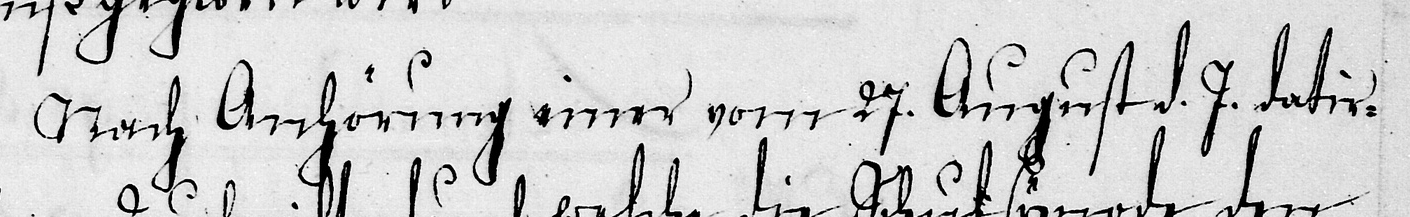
Nach Anhörung einer vom 27. August d. J. datir¬
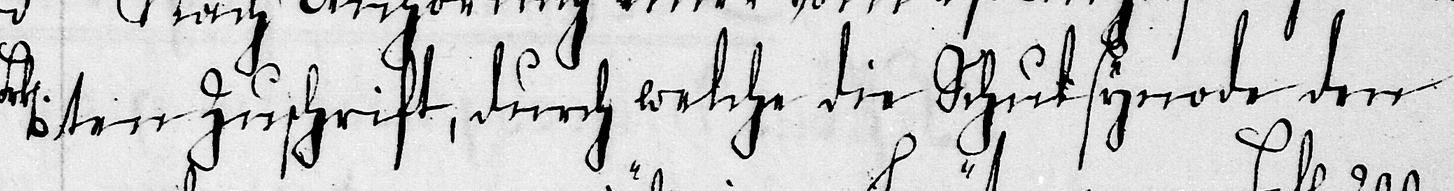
ten Zuschrift, durch welche die Schulsynode den
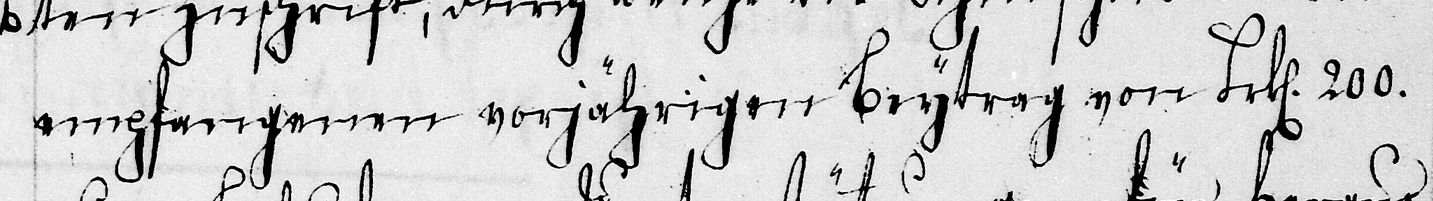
empfangenen vorjährigen Beytrag von Frk[en]. 200.
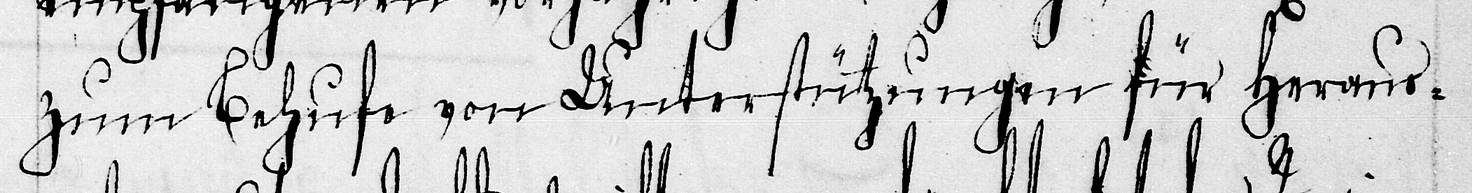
zum Behufe von Unterstützungen für Heraus¬
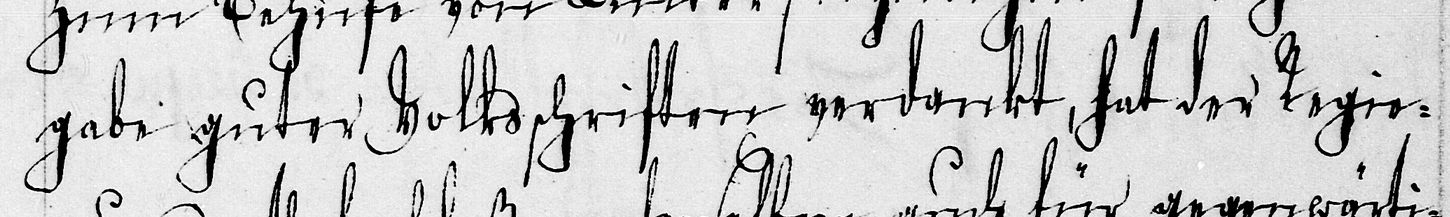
gabe guter Volksschriften verdankt, hat der Regie¬
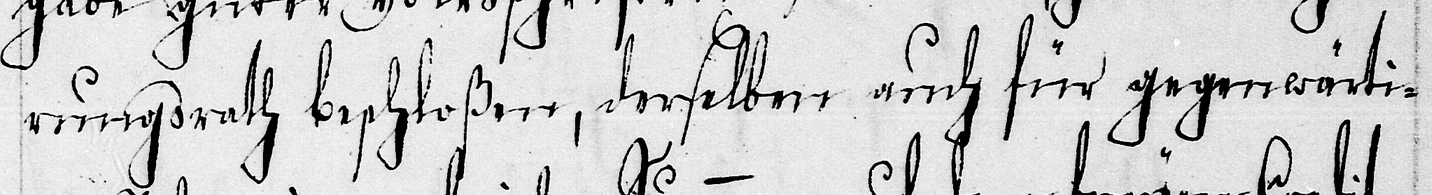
rungsrath beschloßen, derselben auch für gegenwärti¬
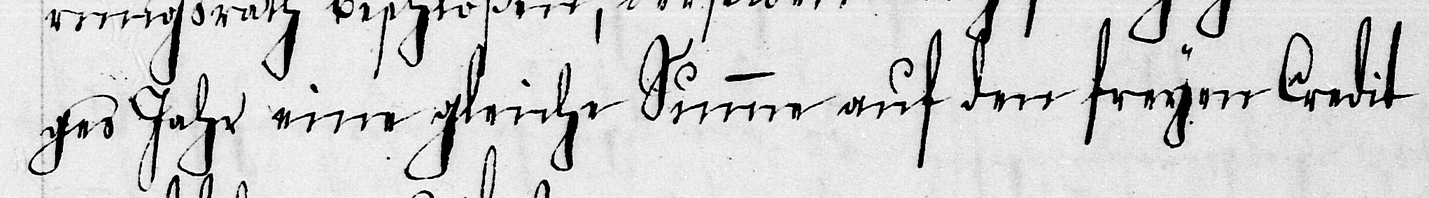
ges Jahr eine gleich Summe auf den freyen Credit
